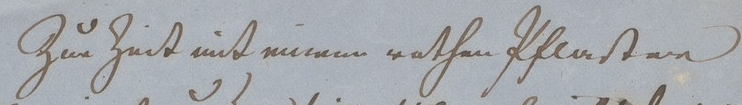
zur Zeit mit einem rothen Pflaster
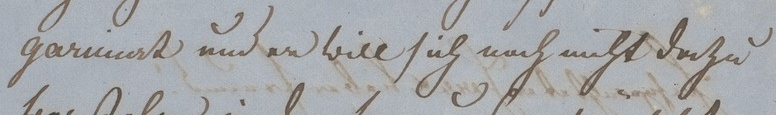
garniert und er will sich noch nicht dazu
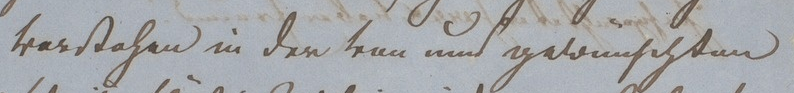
verstehen in der von uns gewünschten
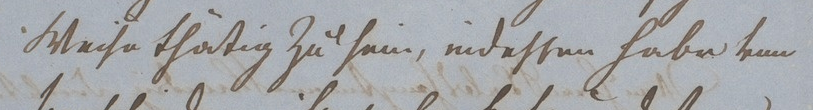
Weise thätig zu sein, indessen habe von
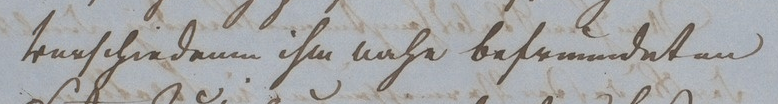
verschiedenen ihm nahe befreundeten
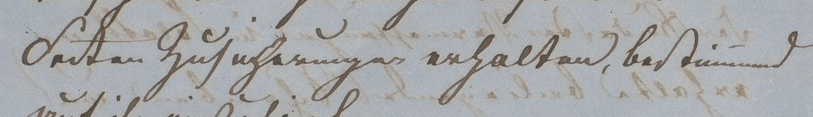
Seiten Zusicherungen erhalten, bestimmend
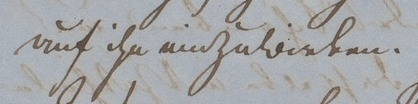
auf ihn einzuwirken.
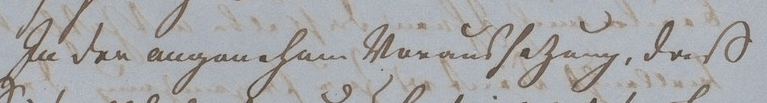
In der angenehmen Voraussetzung, daß
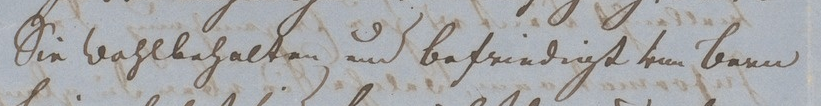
Sie wohlbehalten und befriedigt von Bern
